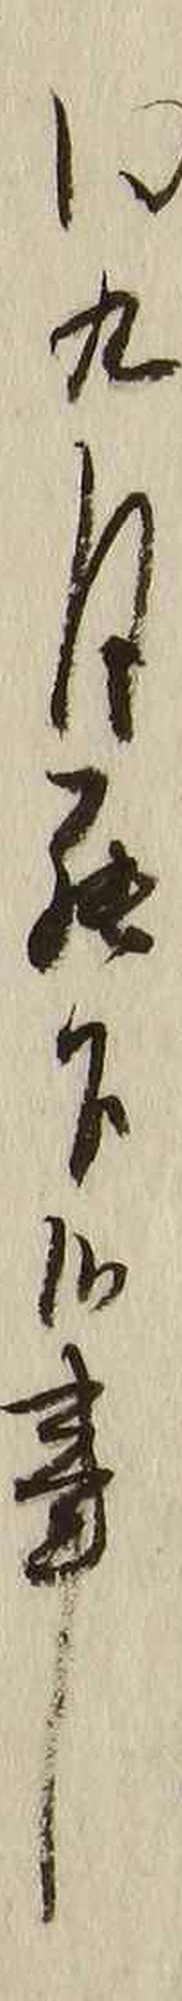同九月罷下候事
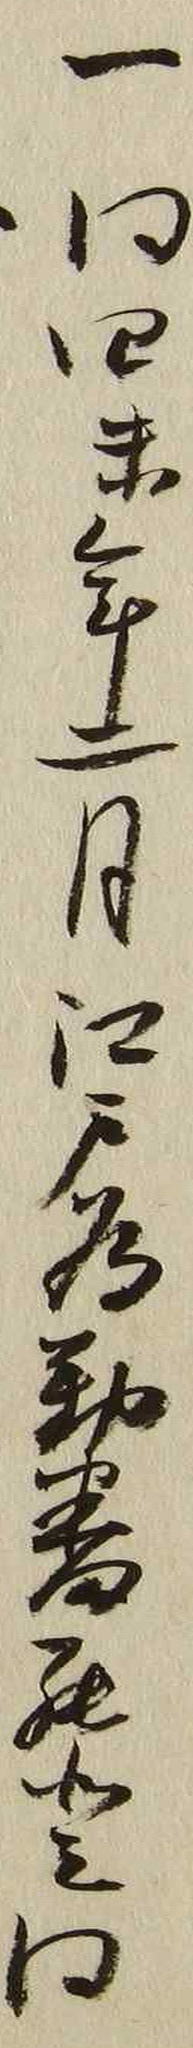一同四未年二月江戸為勤番罷登同
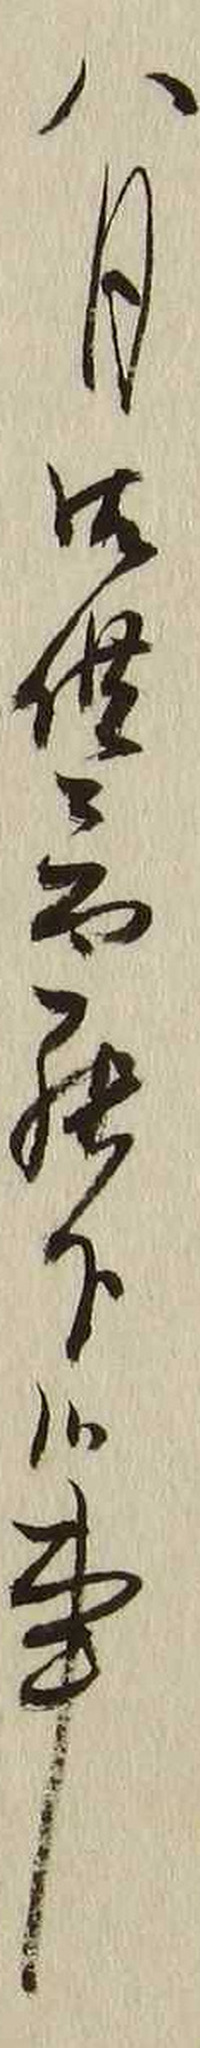八月御供ニ而罷下候事
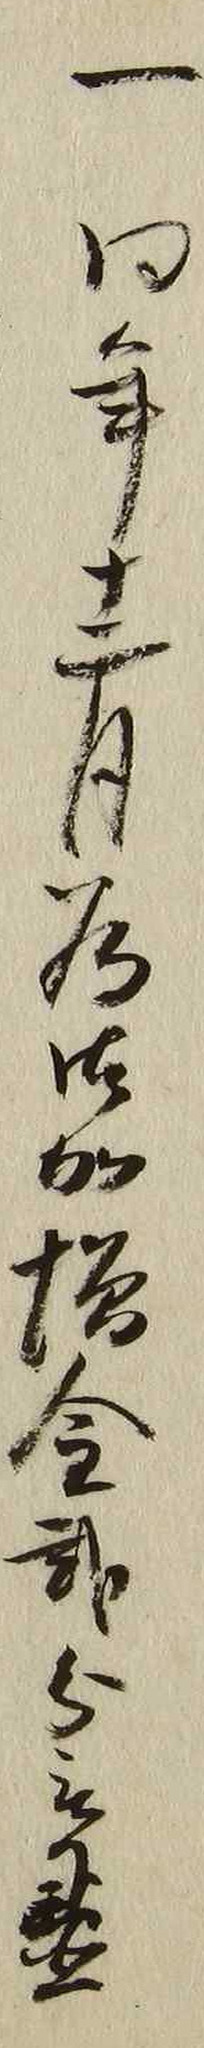一同年十二月為御加増金弐分被下置
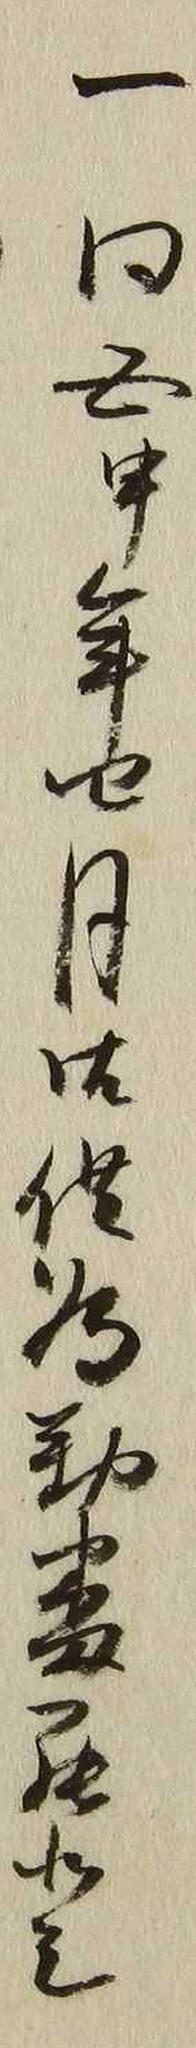一同五申年四月御供為勤番罷登
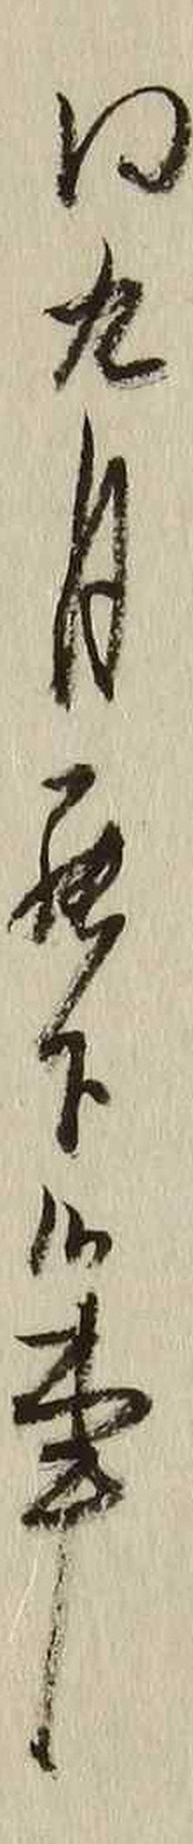同九月罷下候事
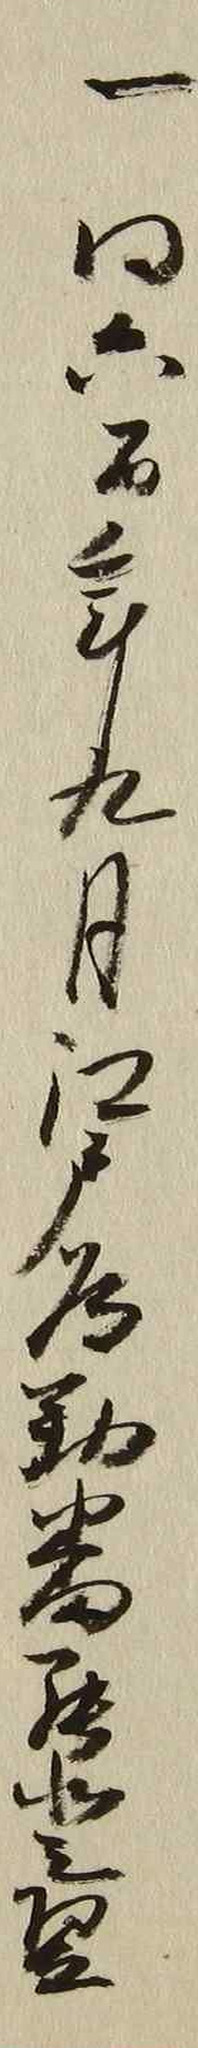一同六酉年九月江戸為勤番罷登翌
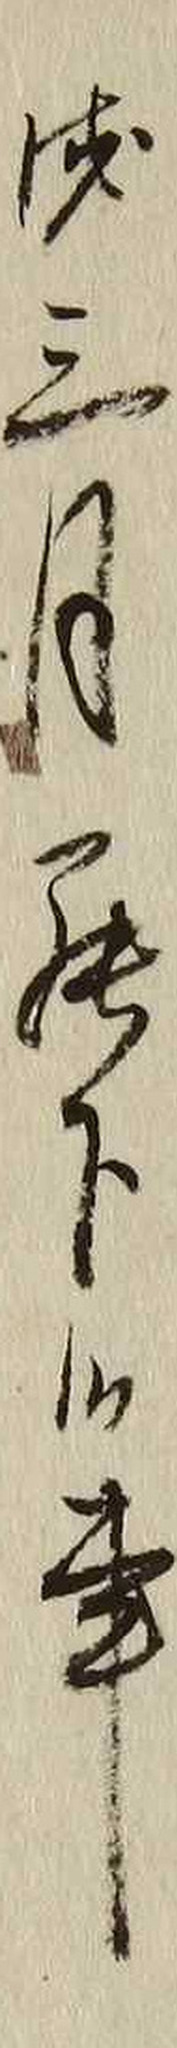戌三月事罷下候事
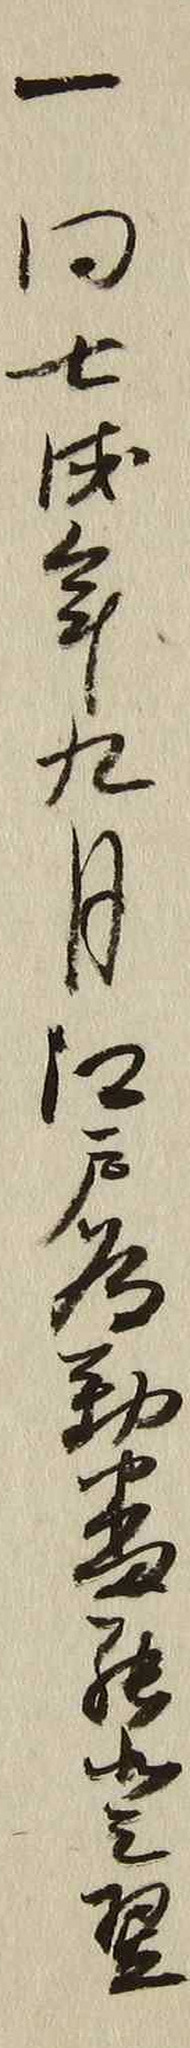一同七戌年九月江戸為勤番罷登翌
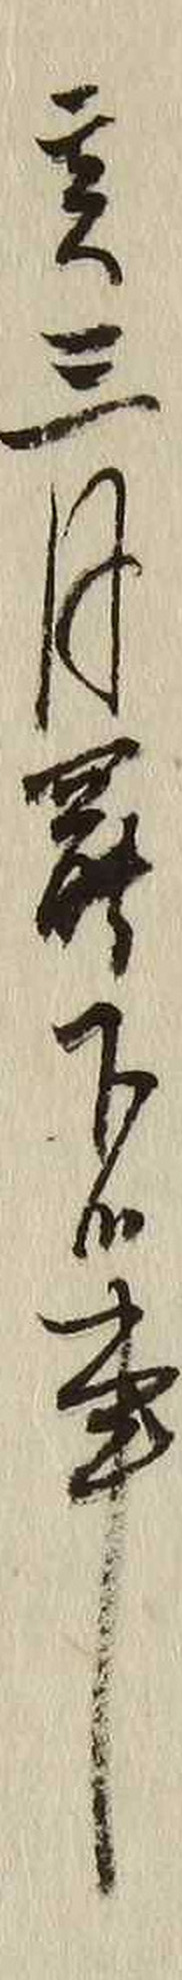亥三月罷下候事
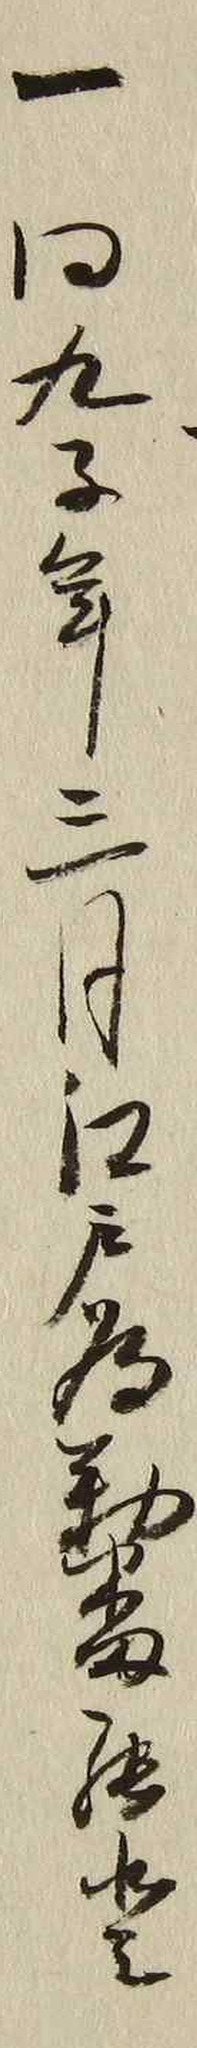一同九子年三月江戸為勤番罷登
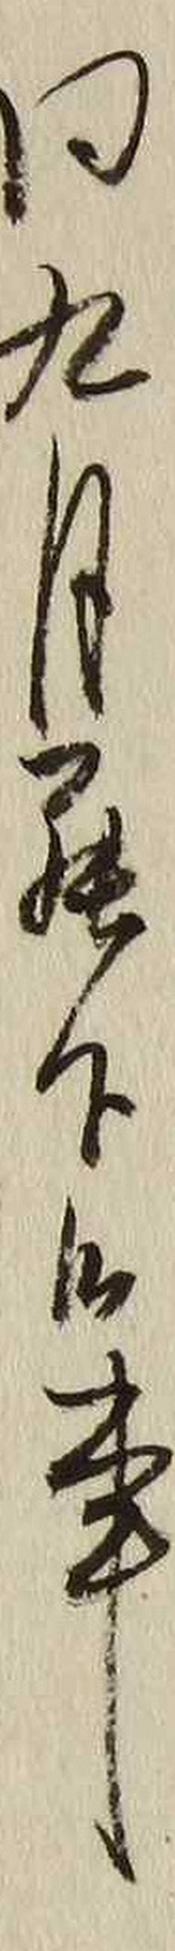同九月罷下候事
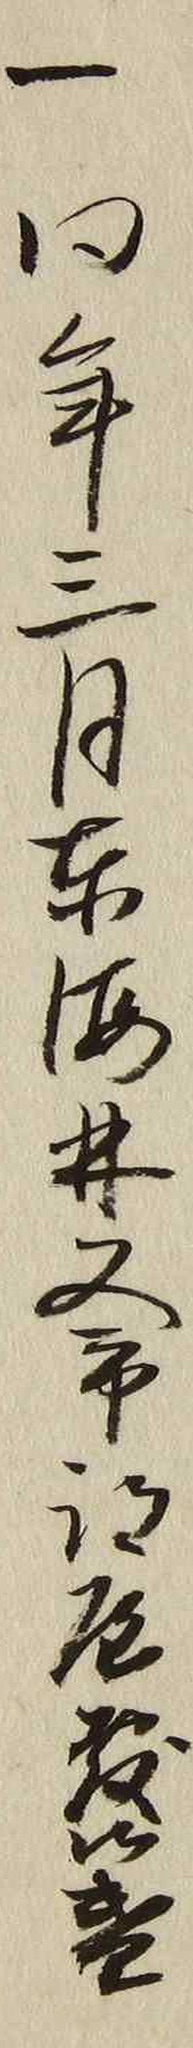一同年三月東海林又市跡屋敷御替
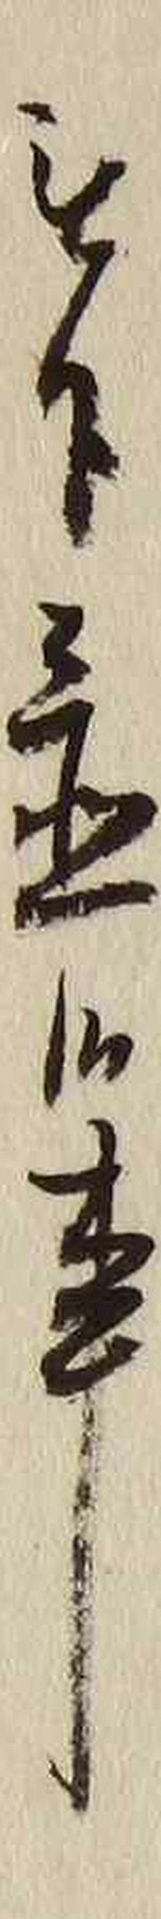被下置候事
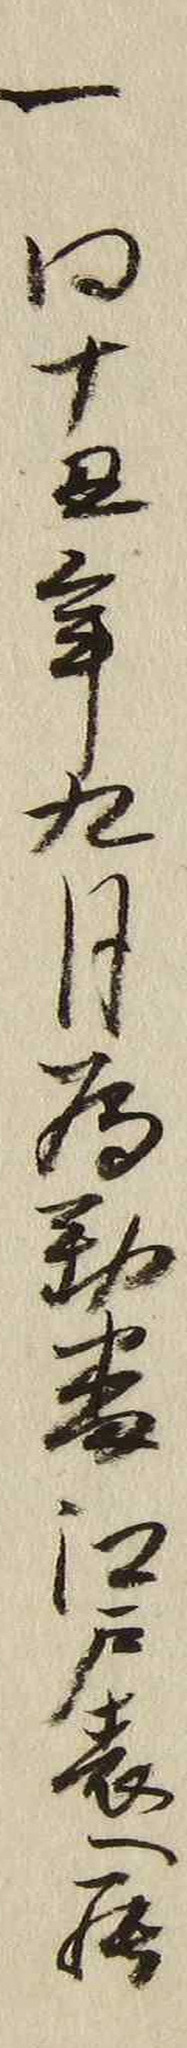一同十丑年九月為勤番江戸表へ罷
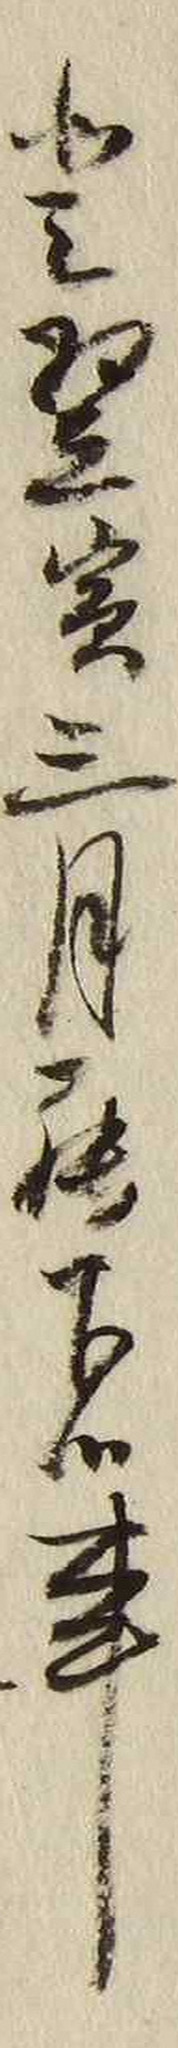登翌寅三月罷下候事
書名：諸士系譜　巻之349　も之部5
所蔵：会津若松市立会津図書館
